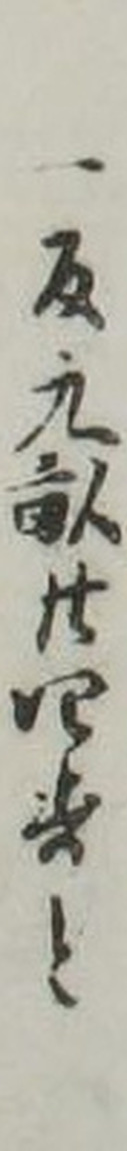一反九畝廿四歩と
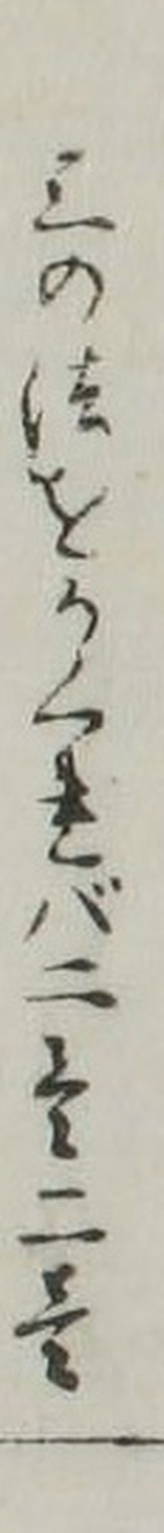三の法をかくれば二壱二壱
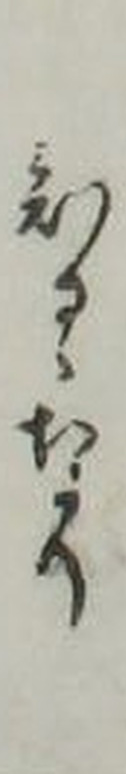知るゝなり
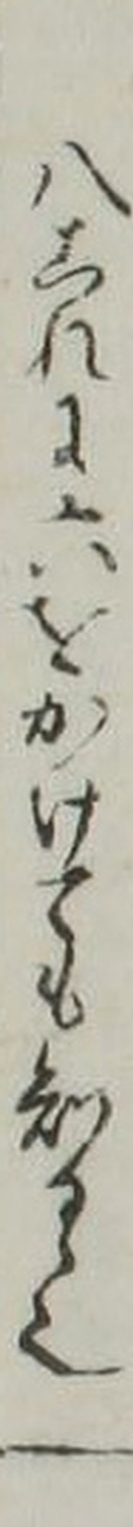八これに六をかけても知るゝ也

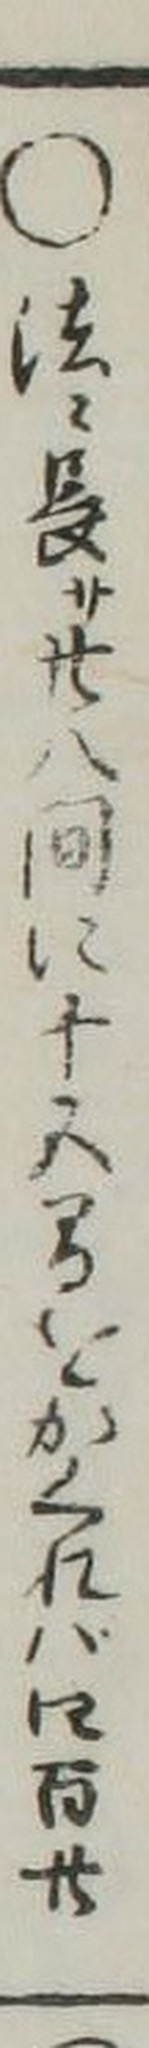○法に長サ二十八間に十五間をかくれば四百廿
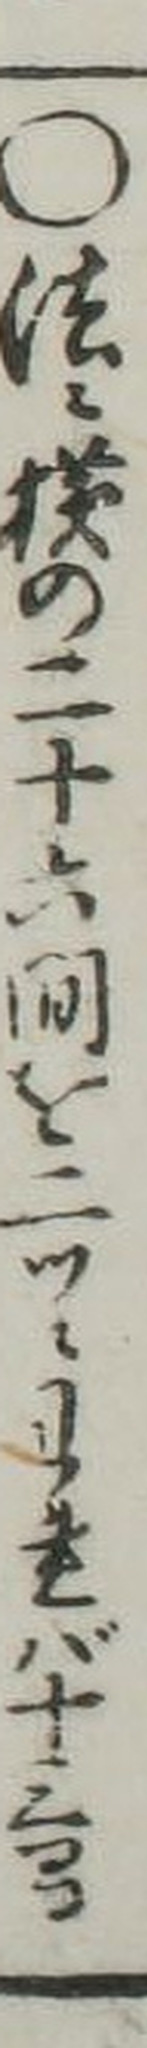○法に横の二十六間を二ツにわれば十三間
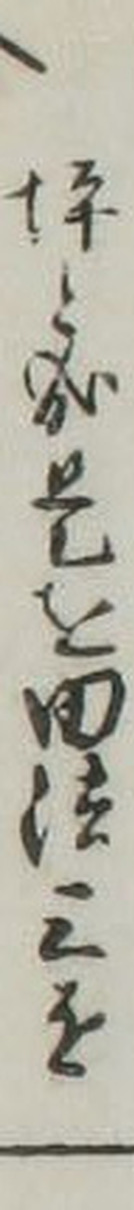間坪と成是を田法三を
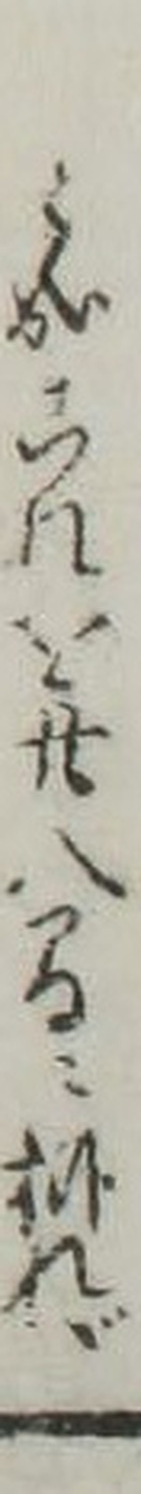と成これを廿八間に掛れば
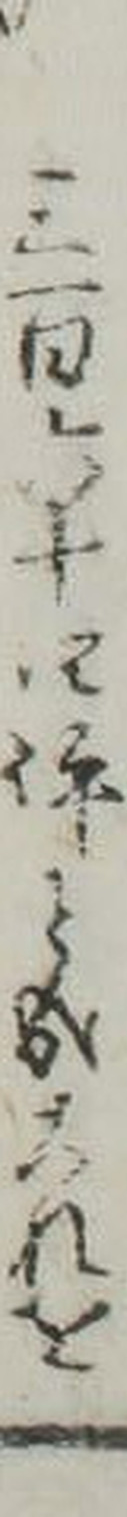間三百六十四坪と成これを
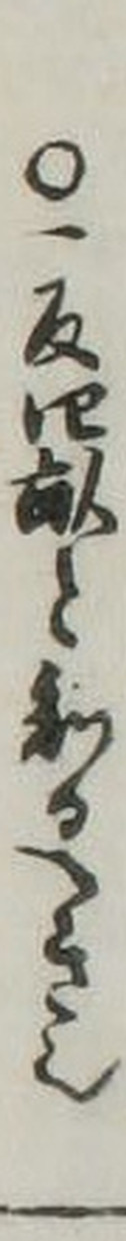十○一反四畝と知るへき也
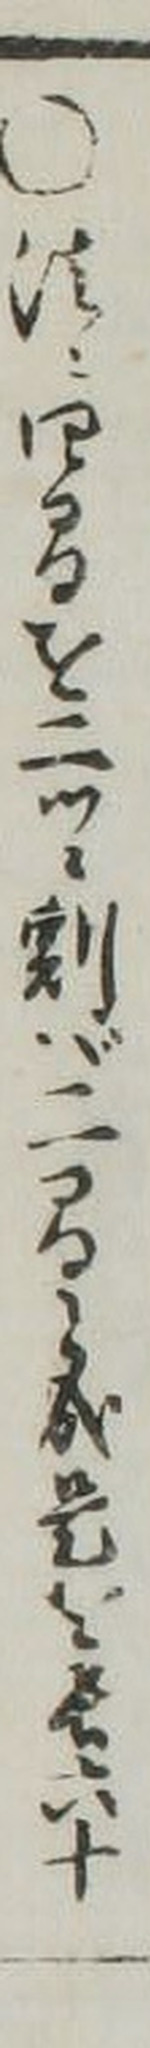○法に四間を二ツに割ば二間と成是を長六十
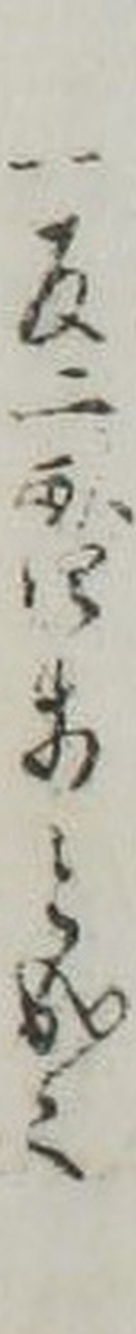廿一反二畝四歩と成也
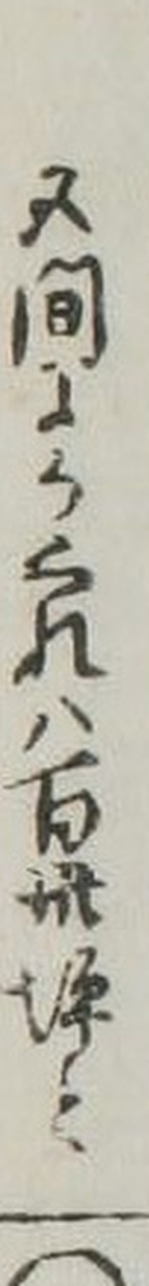四五間にかくれは百卅坪と
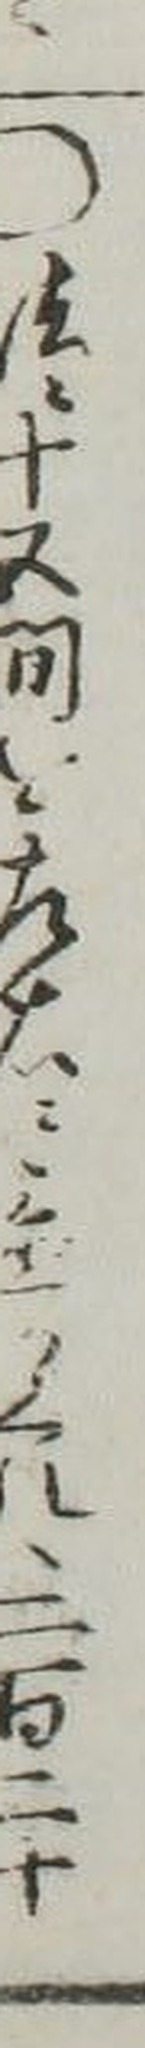○法に十五間を左右に置かくれは二百二十
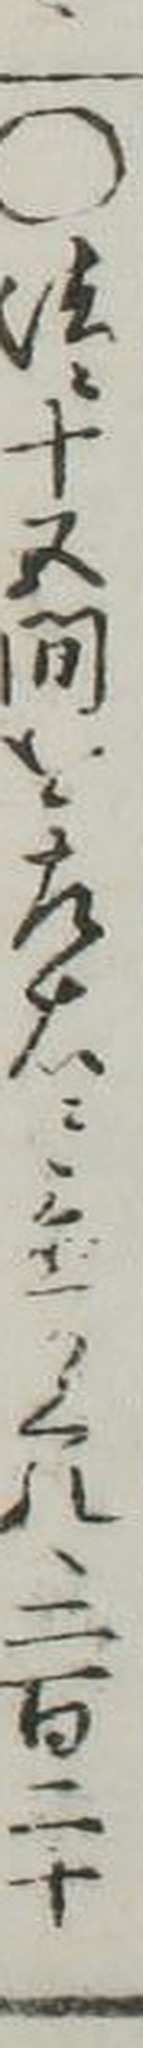○法に十五間を左右に置かくれは二百二十
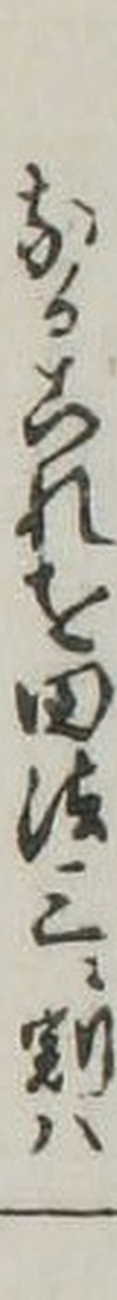間なるこれを田法三に割は
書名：宝玉塵劫記
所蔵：東京学芸大学教育コンテンツアーカイブ
